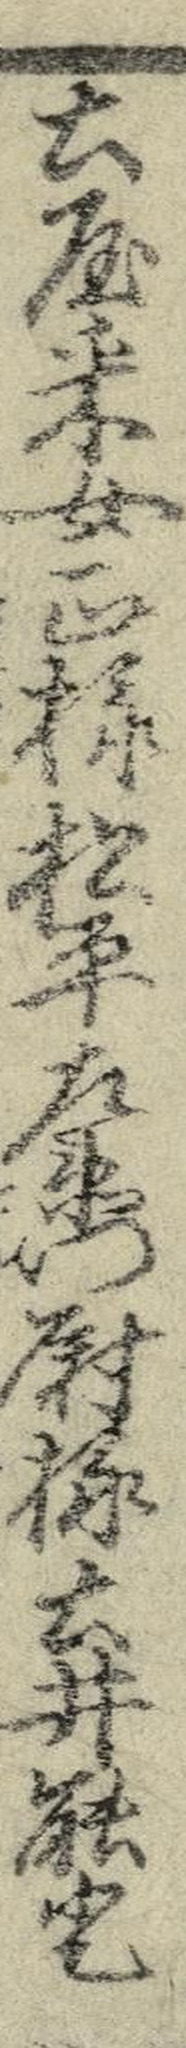大屋采女正様松平左衛門尉様土井能登
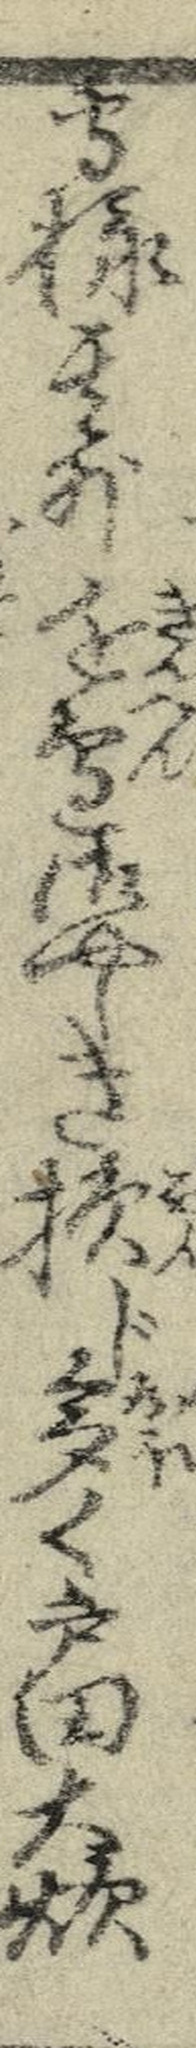守様其外近辺御やしき損じ多く戸田大炊
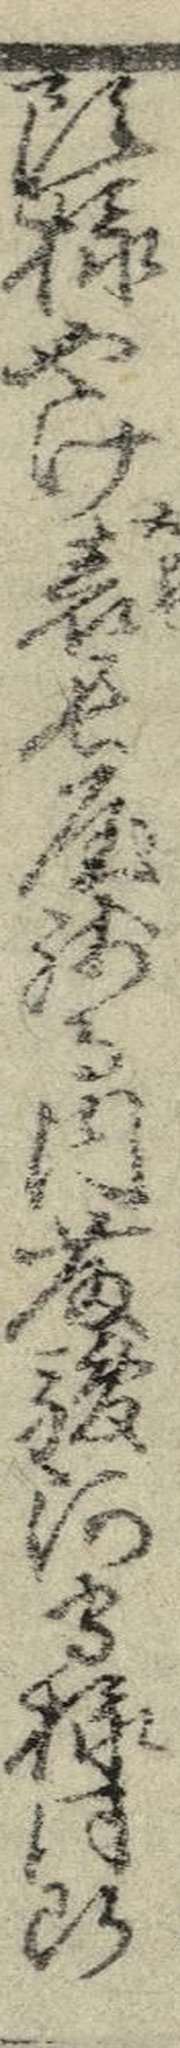頭様やけ表長屋残る円藤駿河守様同断
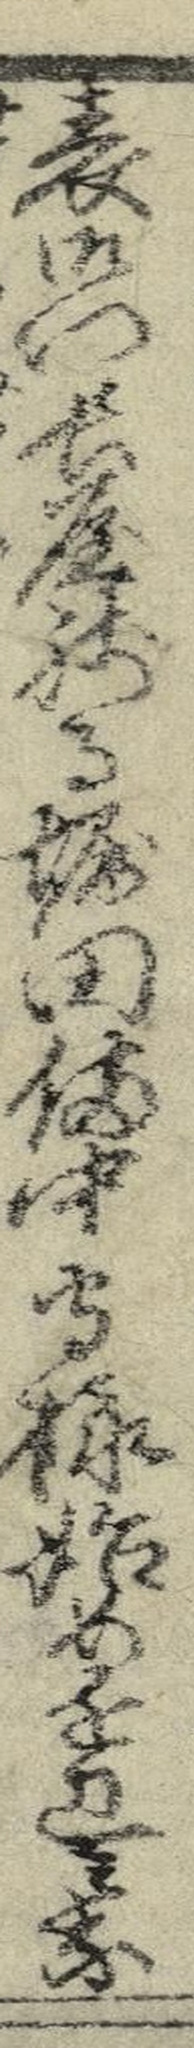表御門長屋残る堀田備中守様始め近辺みな
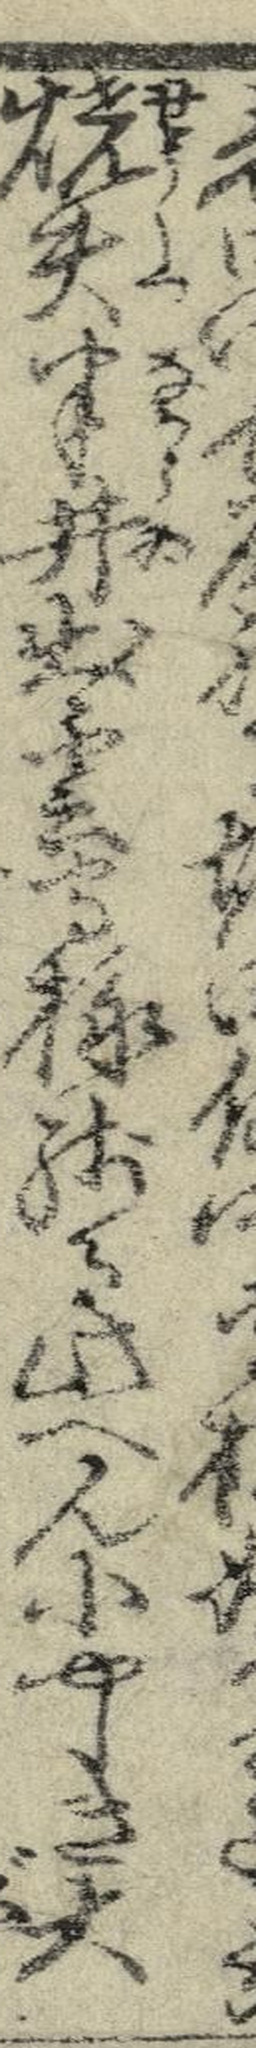焼失半井出雲守様残る此へんにやしき大
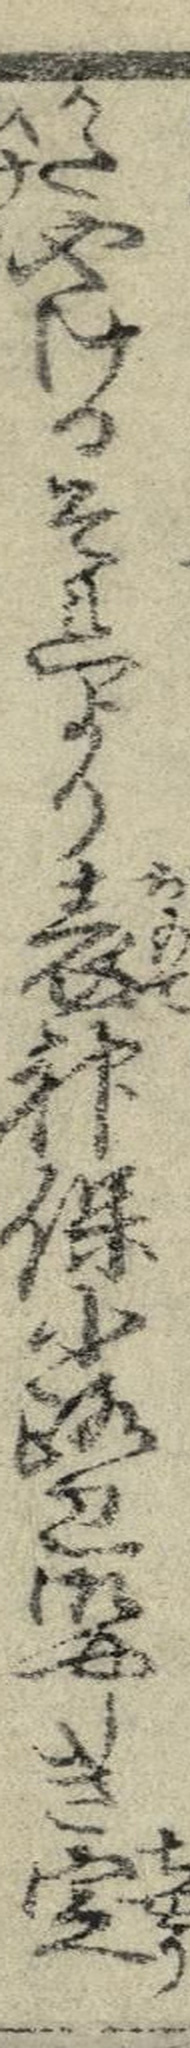かたやけるそれより表神保小路辺御やしき定
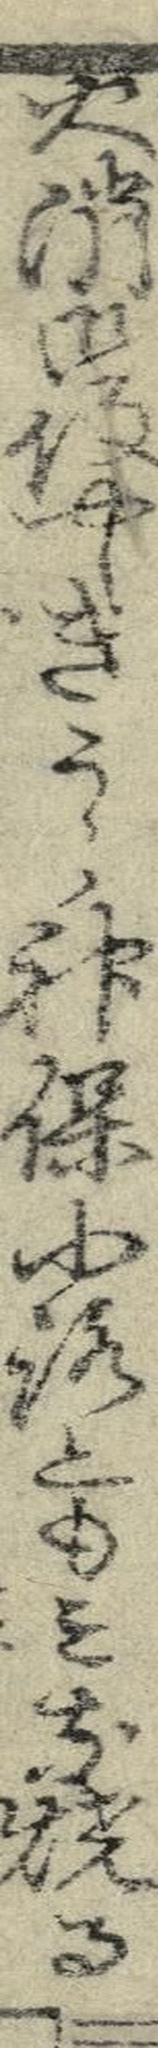火消御役やしきから神保小路ともみな焼る
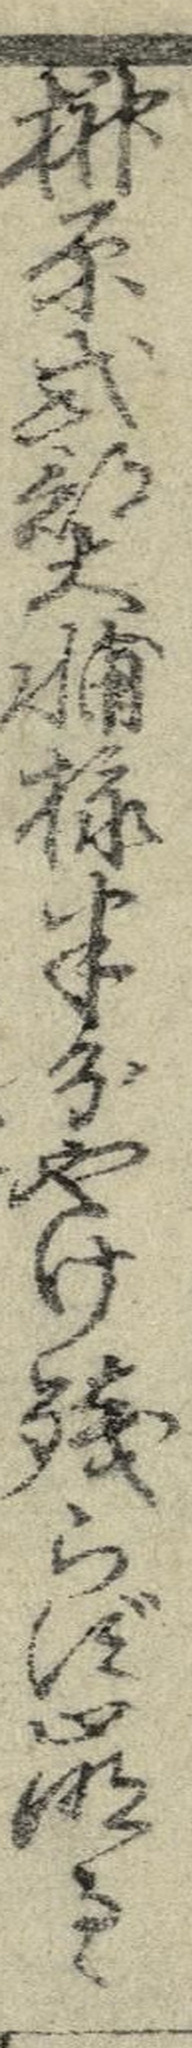榊原式部大輔様半分やけ残らず崩るゝ
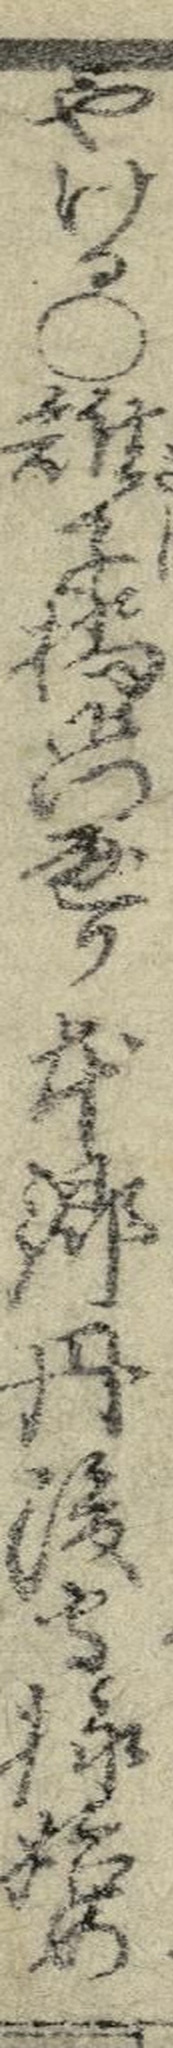やける〇雉子橋御門通り本郷丹後守様始め
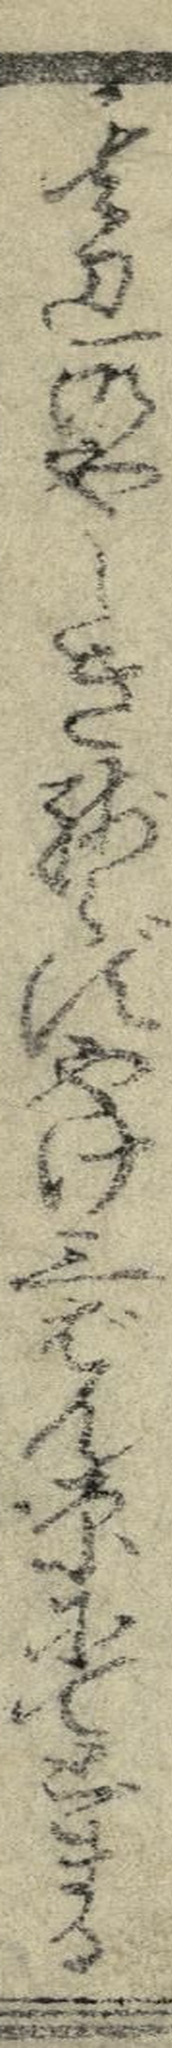其辺御やしき残らずやけ三ばん原にてとまる

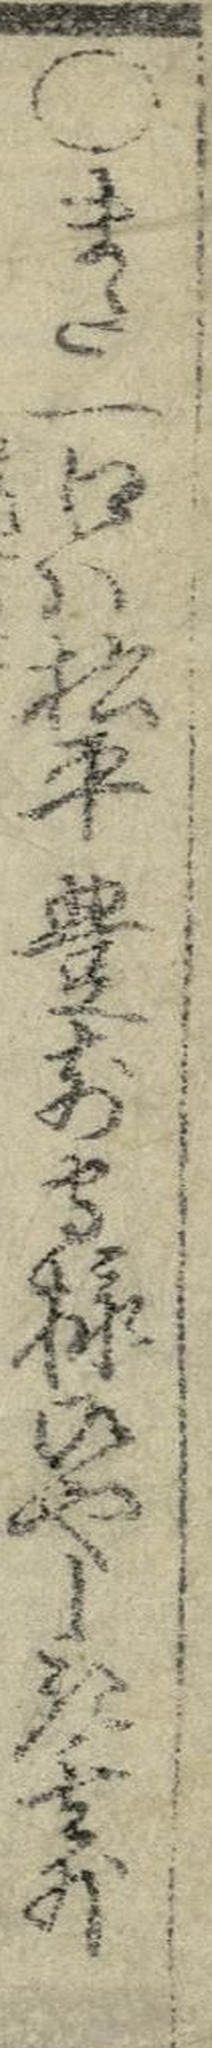〇また一門は松平豊前守様のやしき其外
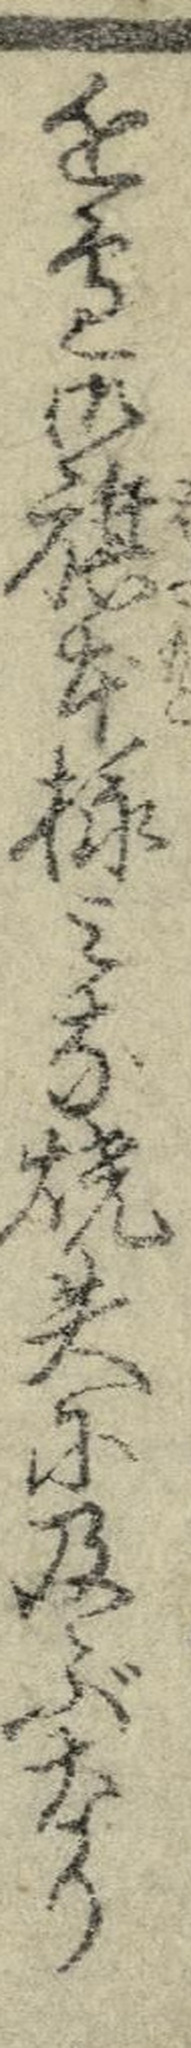近辺御旗本様みな焼失に及ぶなり
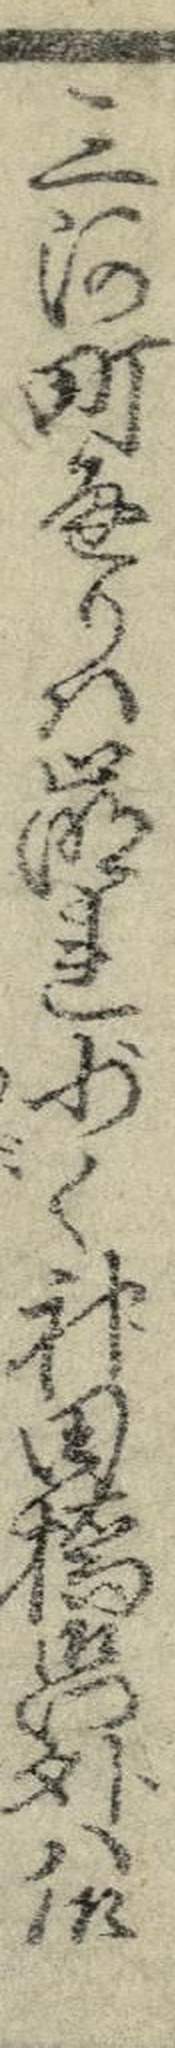三河町通りハ崩れ少く神田橋御門外ハ御
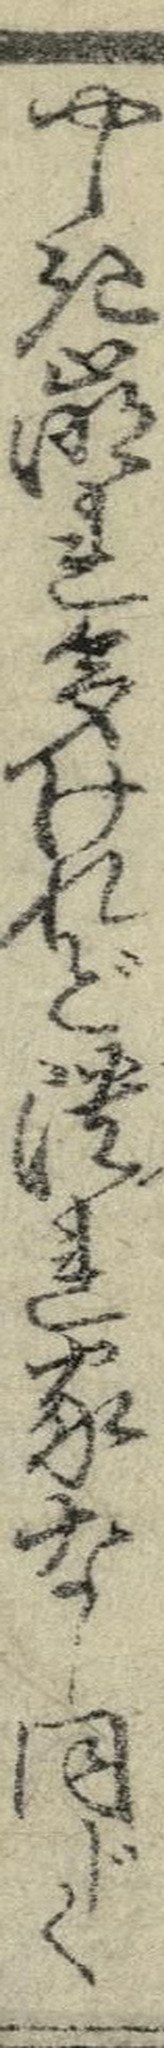やしき崩れ多けれど潰れ家なし同じく
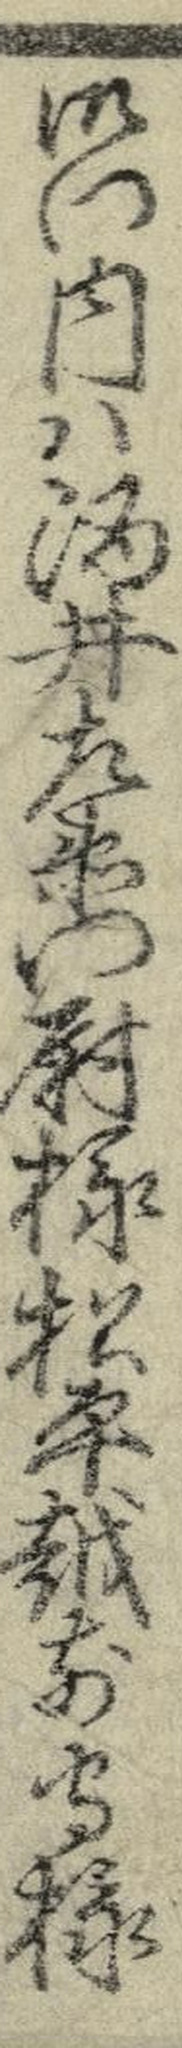御門内ハ酒井左衛門尉様松平越前守様
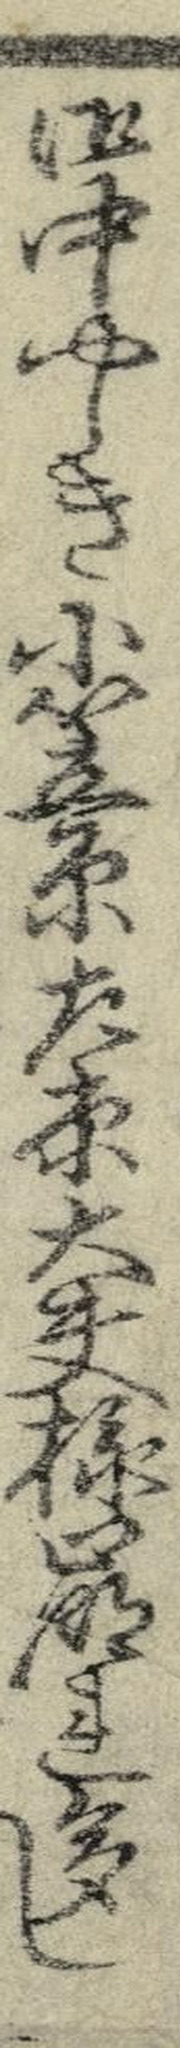御中やしき小笠原左京大夫様崩れ多し
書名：地震並出火細見記
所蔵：東京大学地震研究所図書室 Earthquake Research Institute Library, The University of Tokyo, JAPAN
